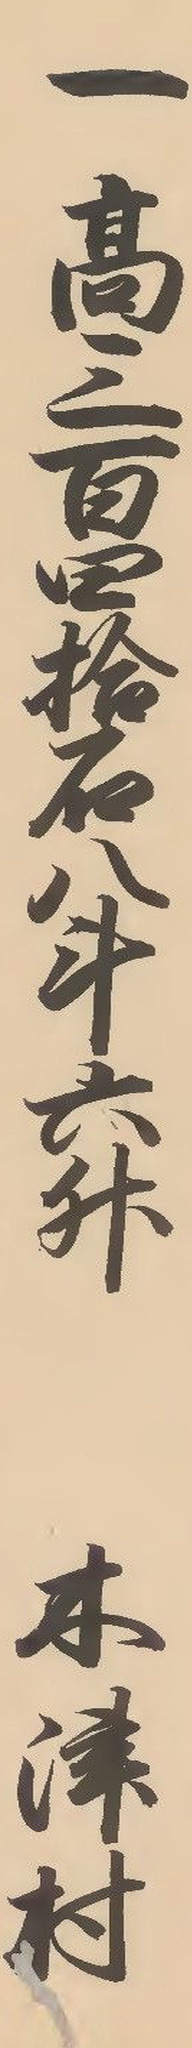一高三百四拾石八斗六升木津村
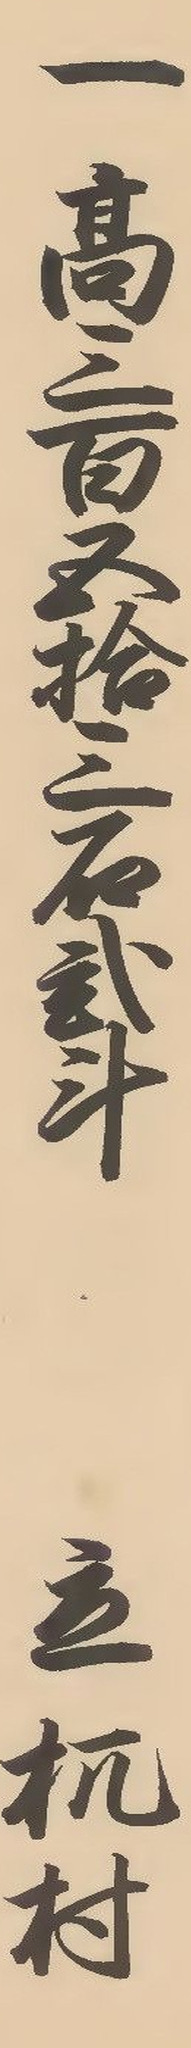一高三百五拾三石弐斗立杭村
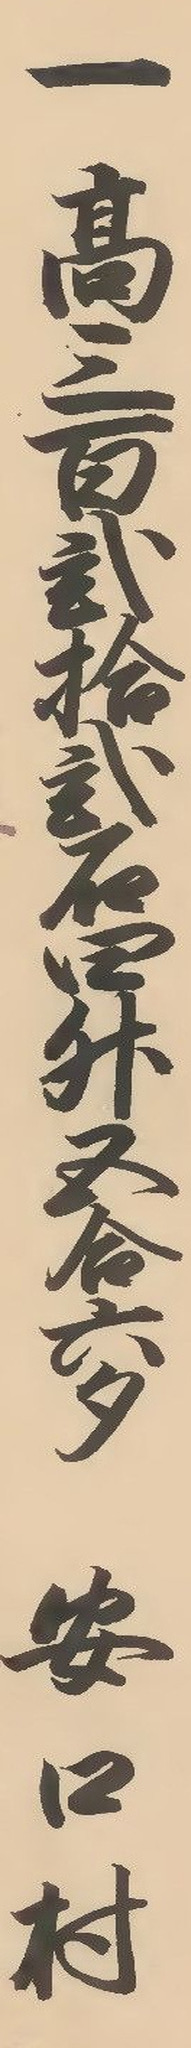一高三百弐拾弐石四升五合六勺安口村

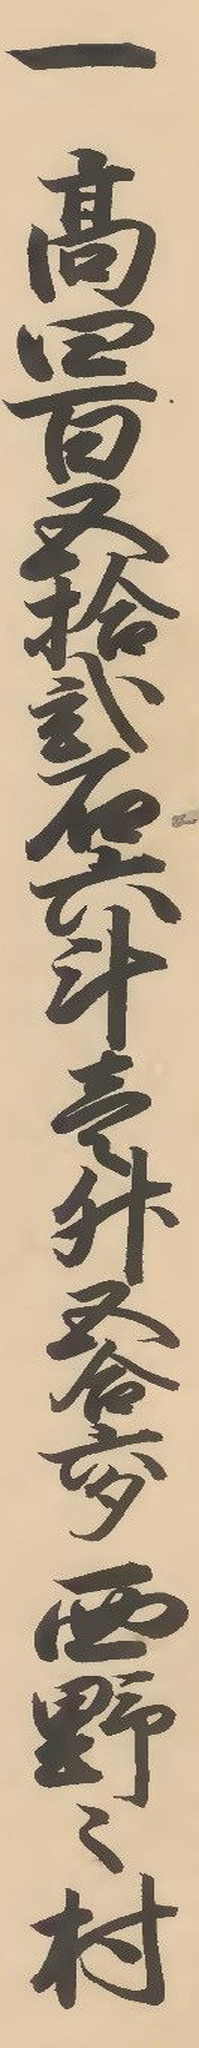一高四百五拾弐石六斗壱升五合六勺西野々村
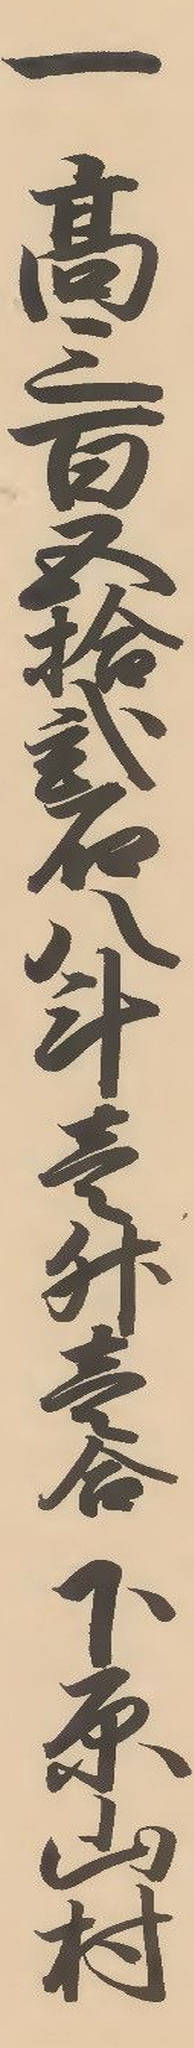一高三百五拾弐石八斗壱升壱合下原山村
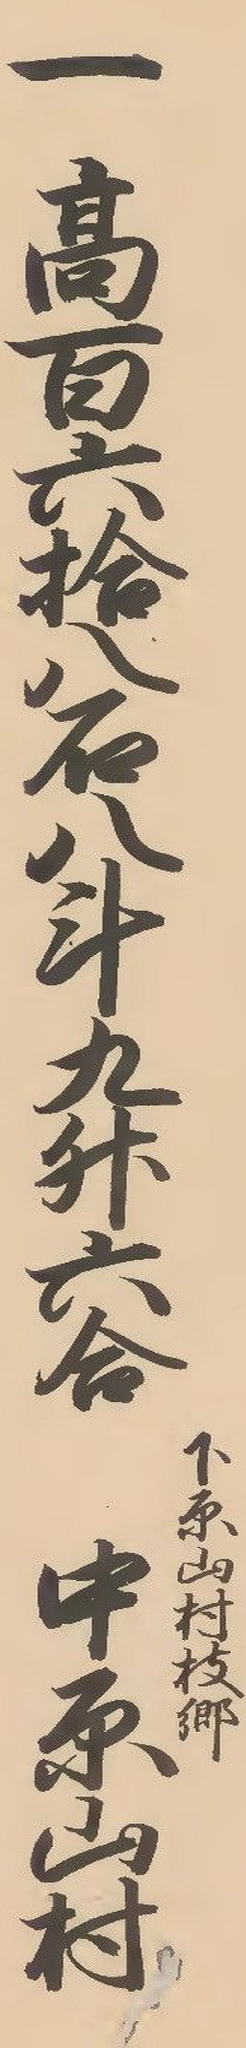一高三百五拾弐石八斗壱升壱合下原山村
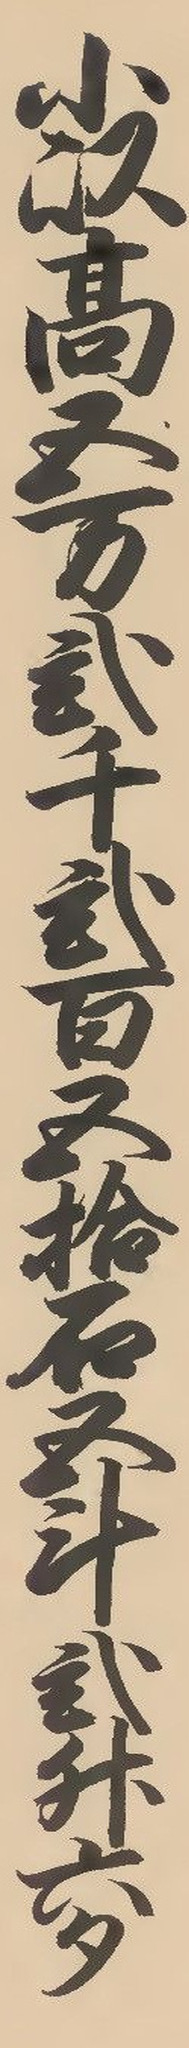小以高五万弐千弐百五拾石五斗弐升六勺
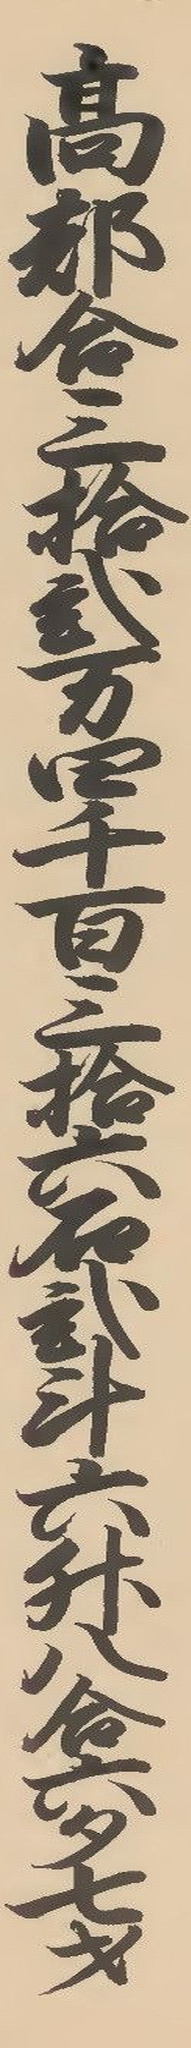高都合三拾弐万四千百三拾六石弐斗六升八合六勺七才
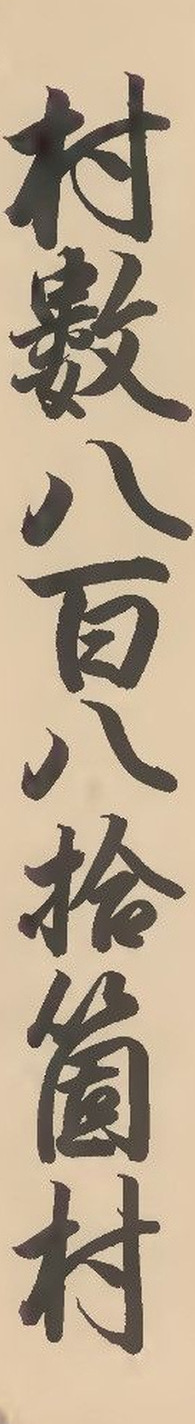村数八百八拾箇村

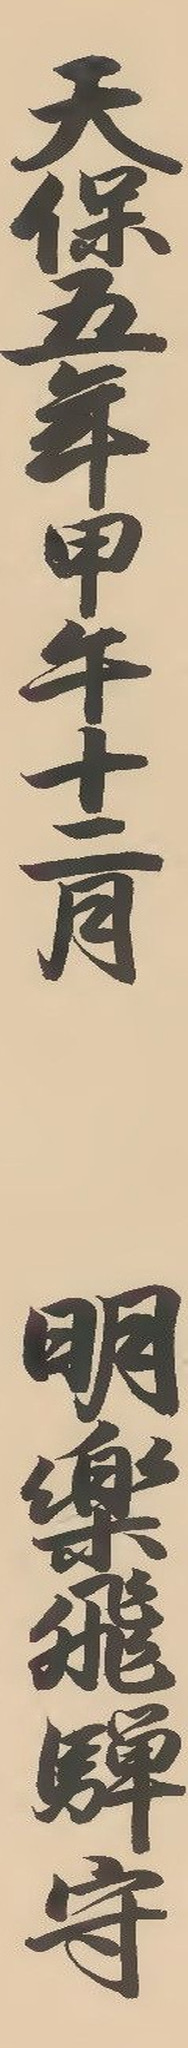天保五年甲午十二月明楽飛騨守
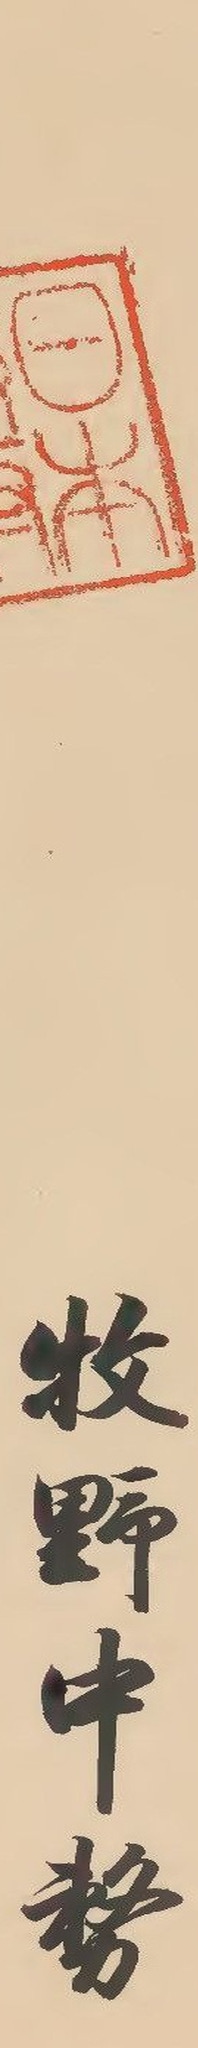牧野中務
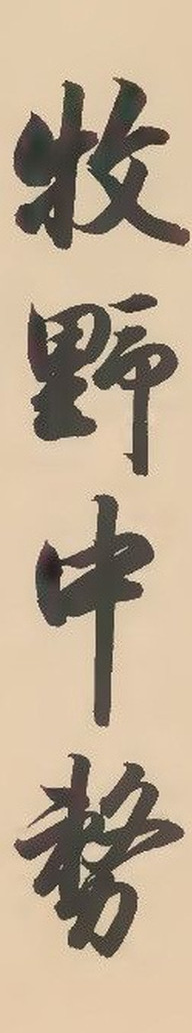牧野中務
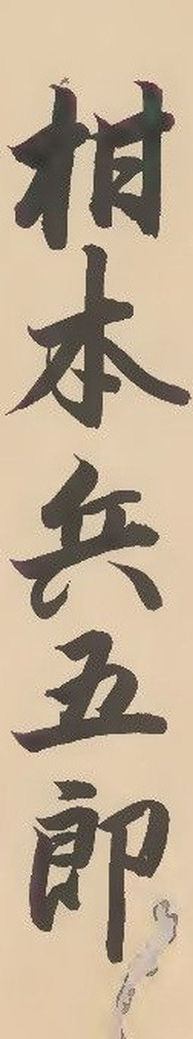柑本兵五郎
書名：丹波国郷帳
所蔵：国立公文書館 National Archives of Japan
